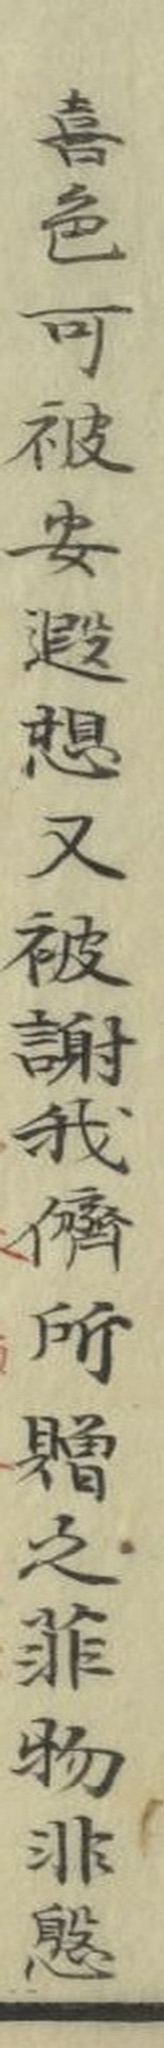喜色可被安遐想又被謝我済所贈之菲物非慇
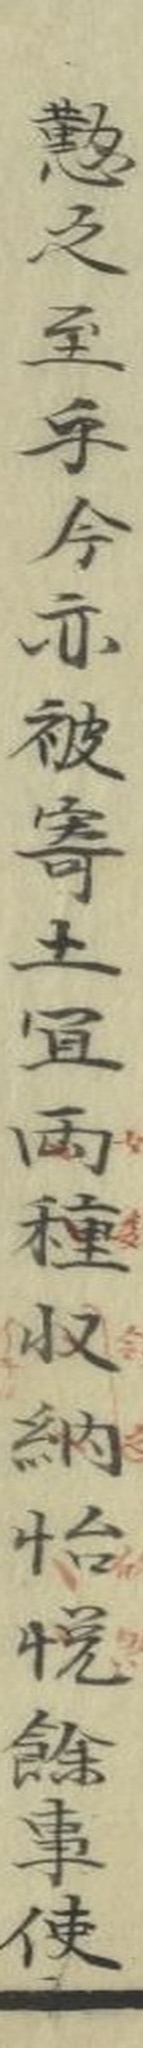懃之至乎今亦被寄土宜両種収納怡悦余事使
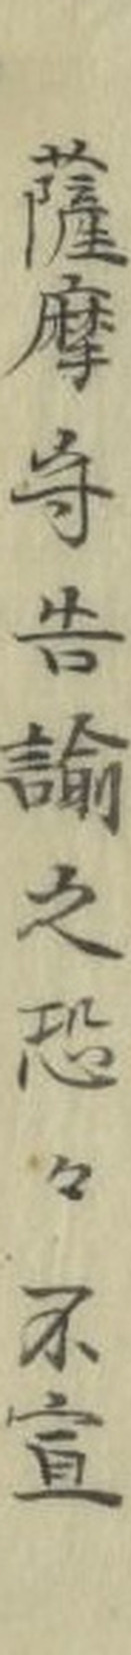薩摩守告諭之恐々不宣
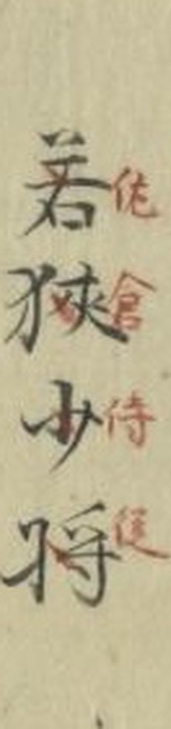若狭少将
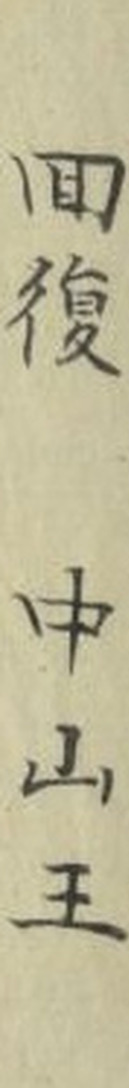回復中山王
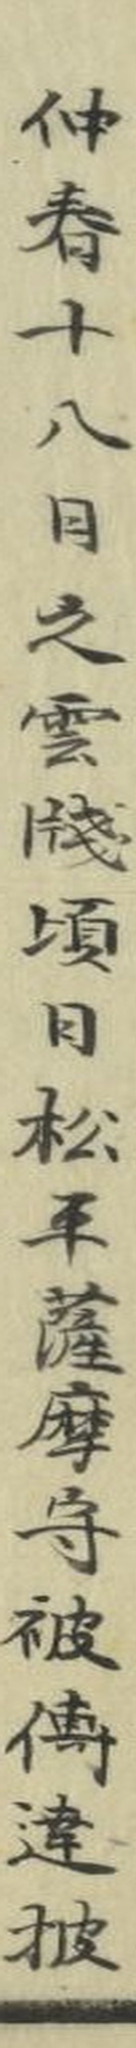仲春十八日之雲桟頃日松平薩摩守被伝達披
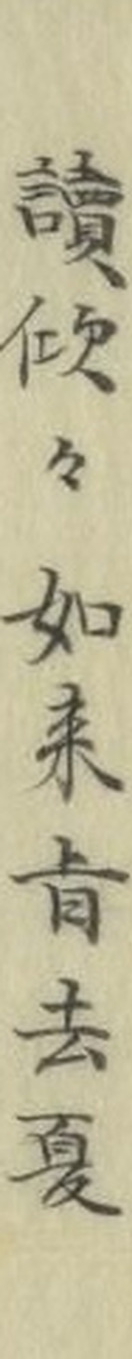読欣々如来旨去夏
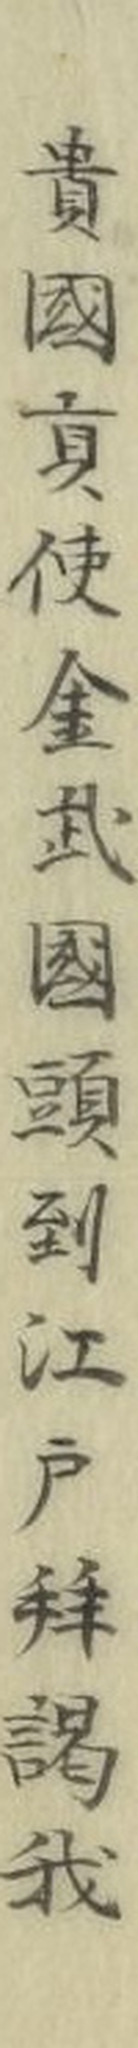貴国貢使金武国頭到江戸拝謁我
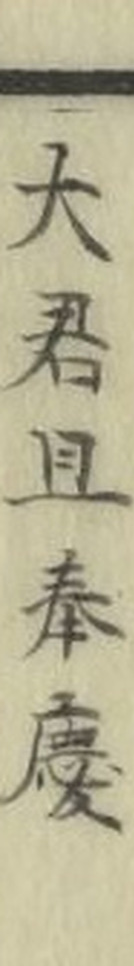大君且奉慶
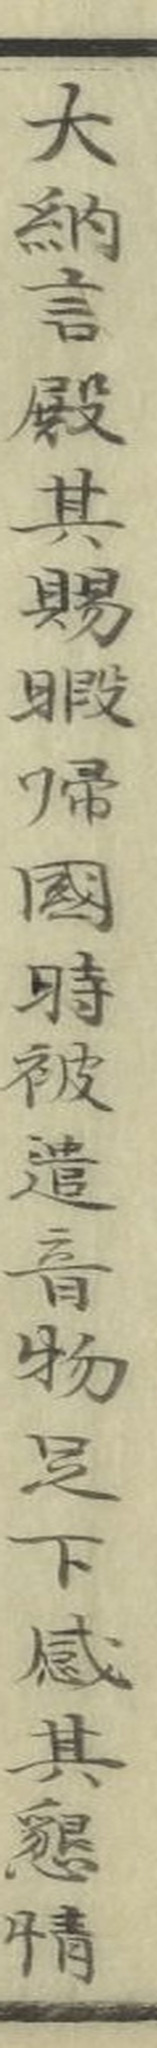大納言殿其賜暇帰国時被遣音物足下感其懇情
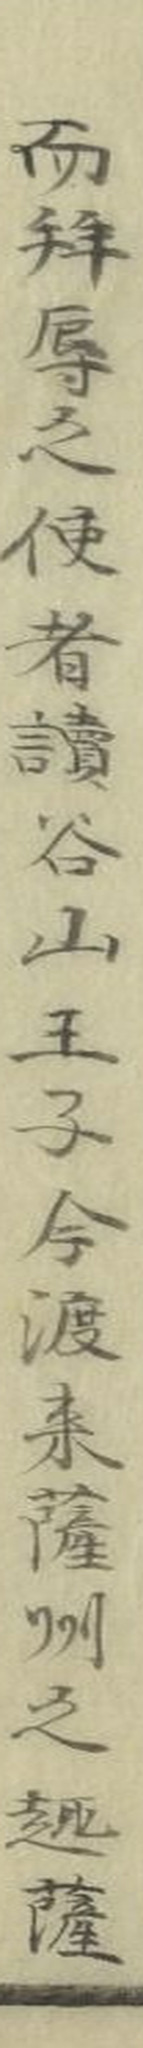而拝辱之使者読谷山王子今渡来薩州之趣薩
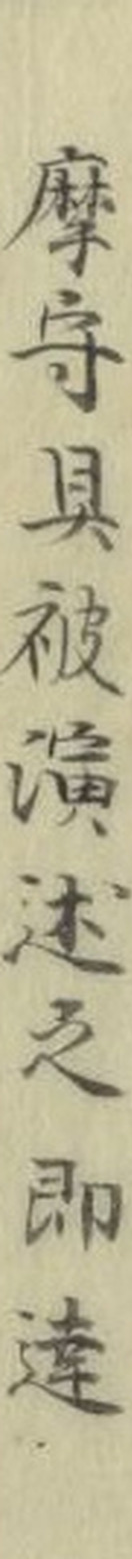摩守具披演述之即達
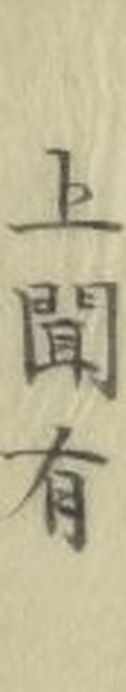上聞有

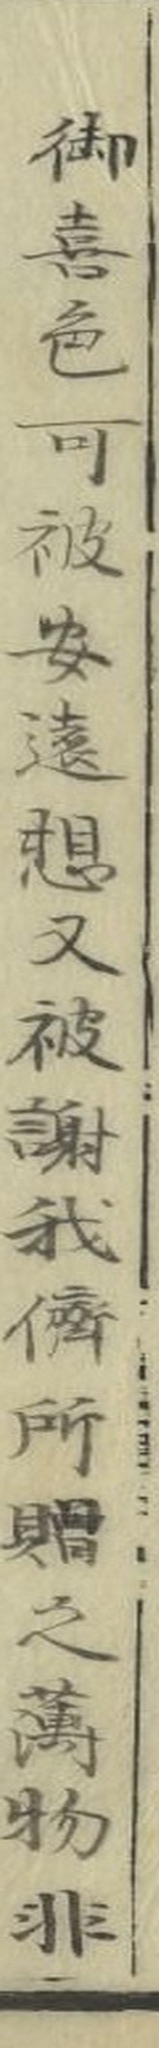御喜色可被安遠想又被謝我済所贈之薄物非
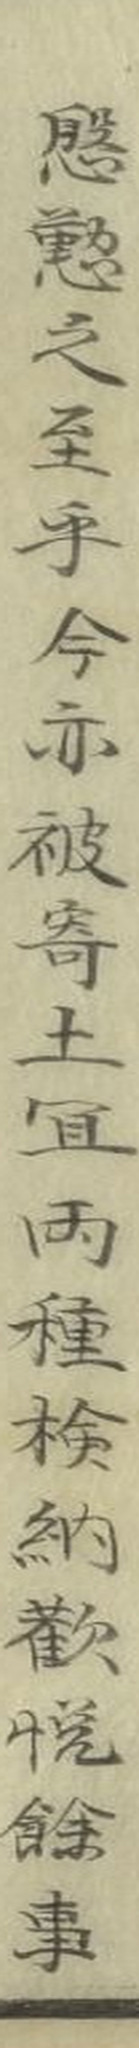慇懃之至乎今亦被寄土宜両種検納歓悦余事
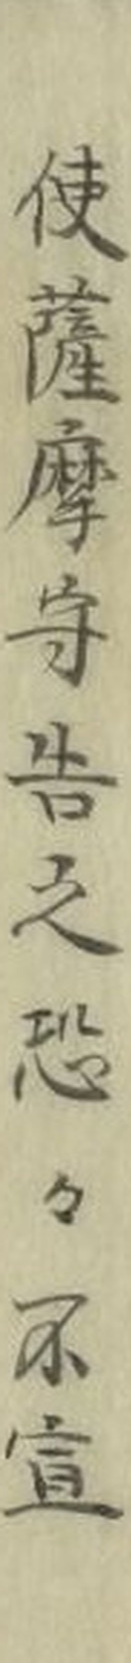使薩摩守告之恐々不宣
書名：琉球往来（上）
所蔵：University of the Ryukyus Library
